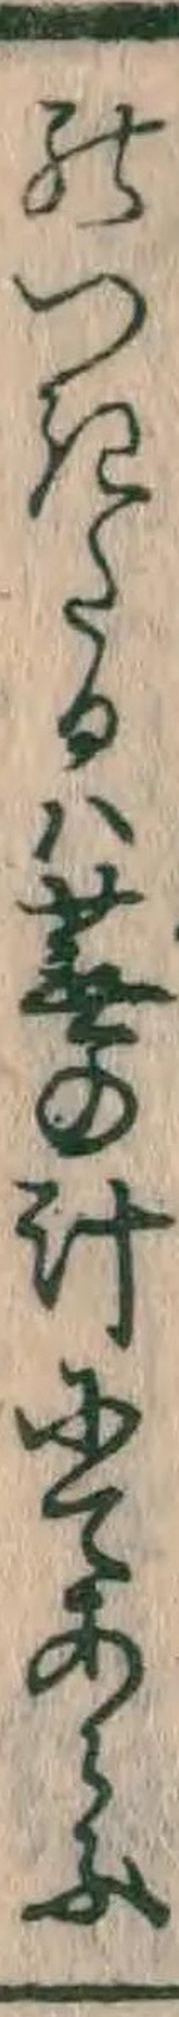のつきたるは蕪の汁にてあらふ
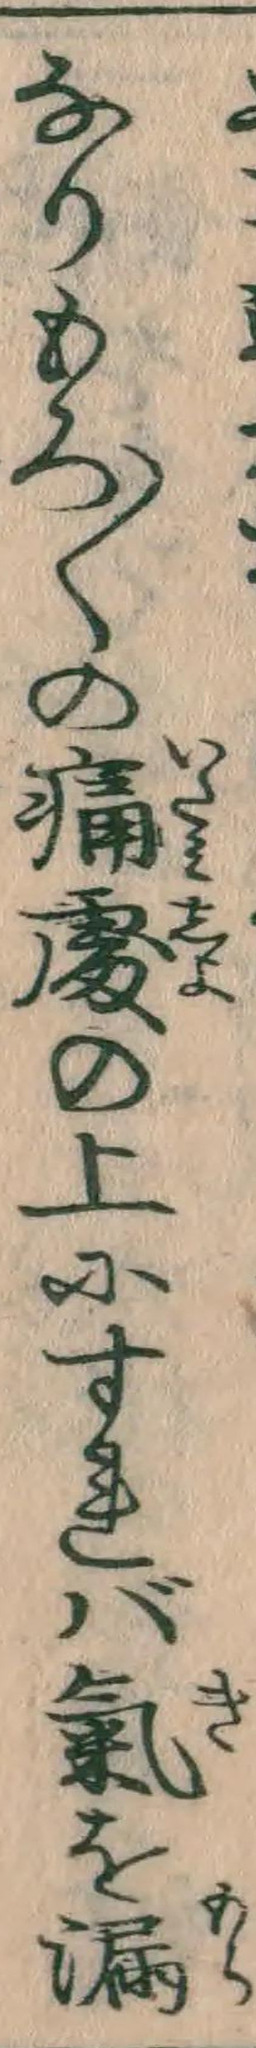なりもろ〳〵の痛處の上にすれば気を漏
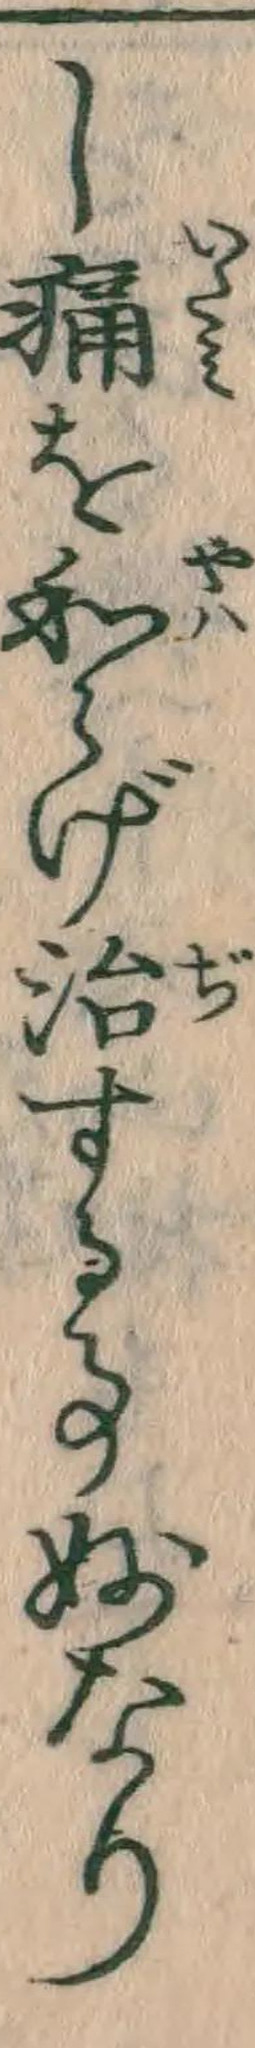し痛を和らげ治する事妙なり
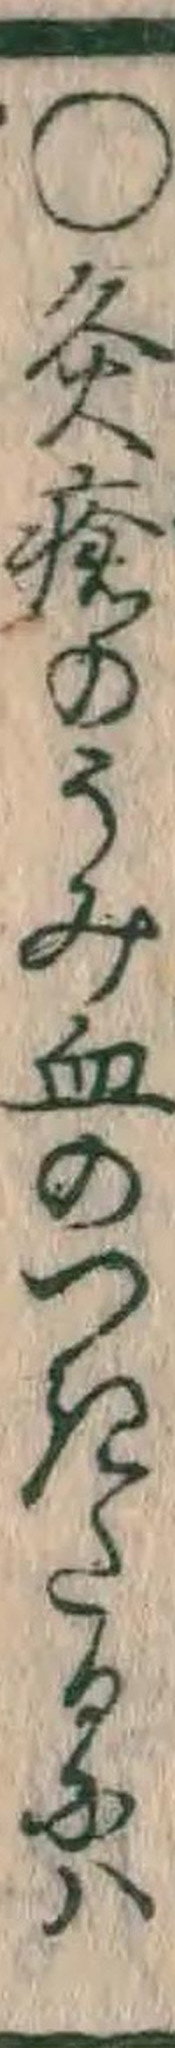○灸瘡のうみ血のつきたるには
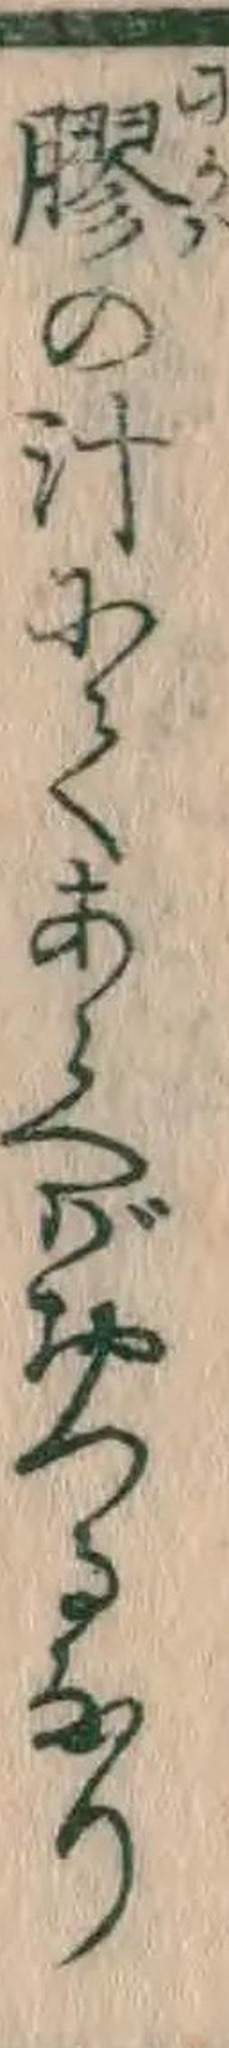膠の汁にてあらへばおつるなり
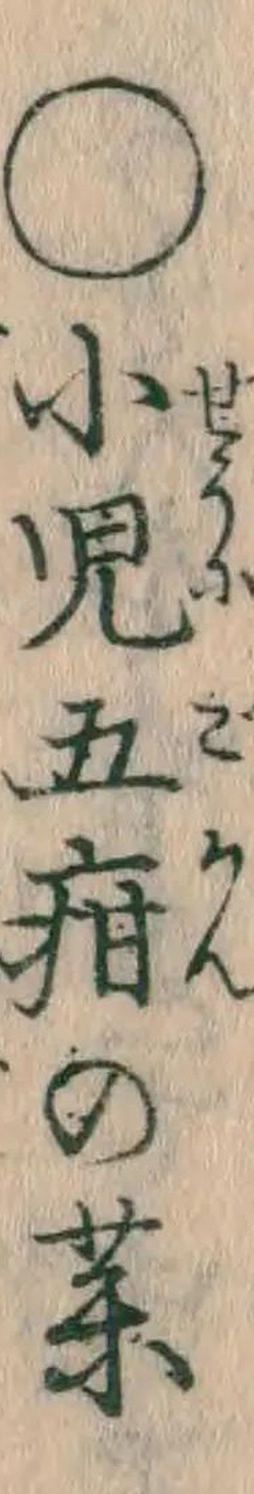○小児五疳の薬
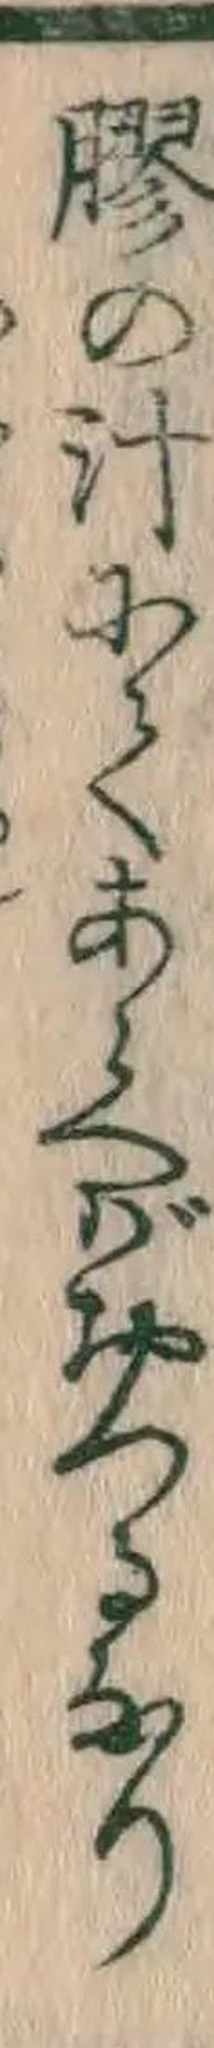膠の汁にてあらへばおつるなり
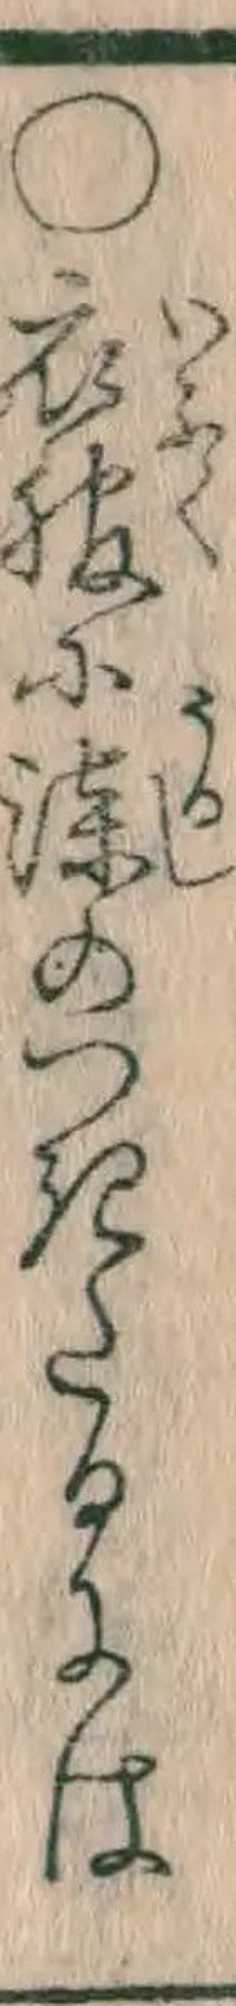○衣服に漆のつきたるには
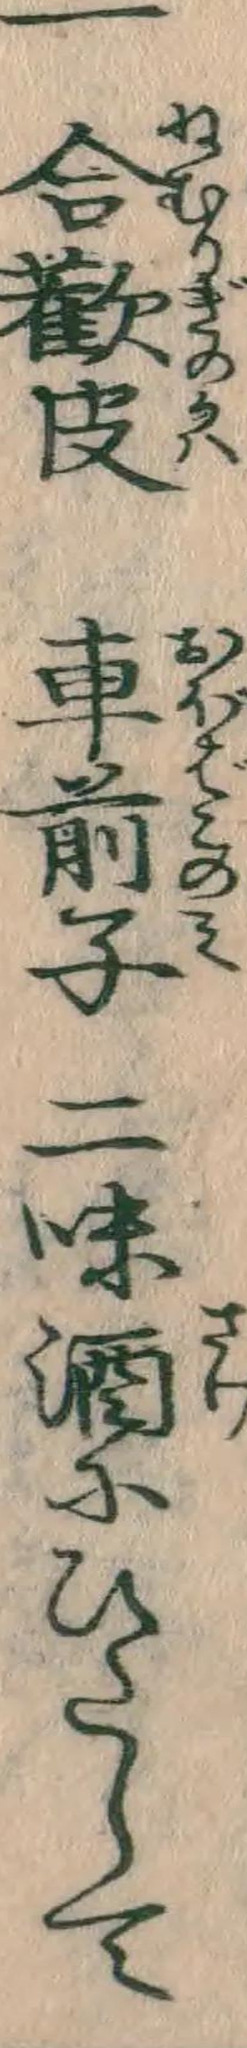一合歓皮車前子二味酒にひたして
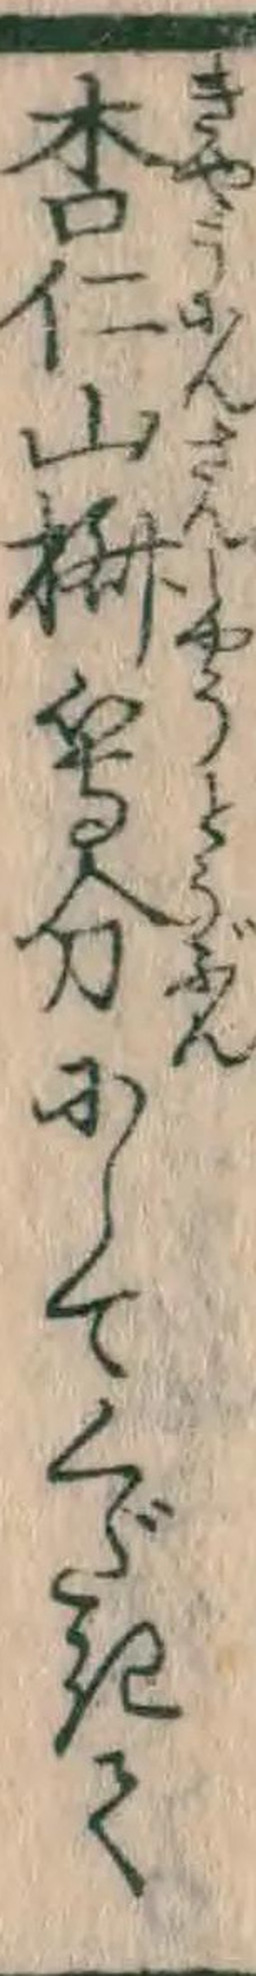杏仁山椒等分にしてくだきて
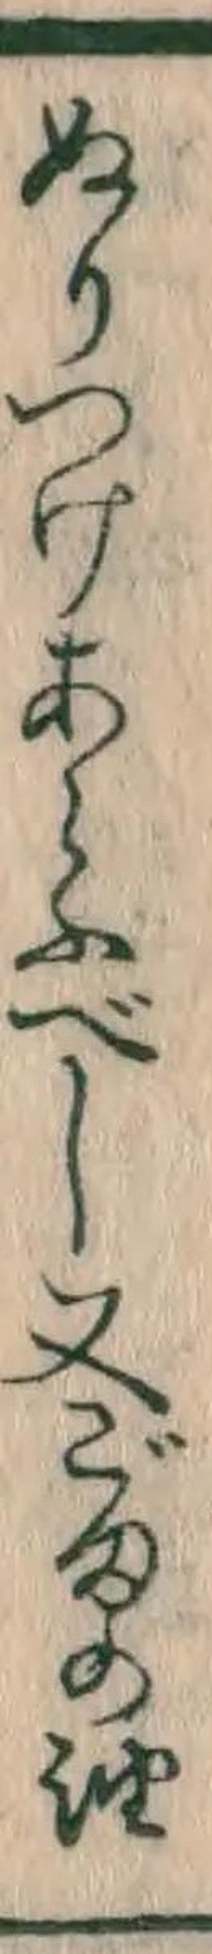ぬりつけあらふべし又ごまの油
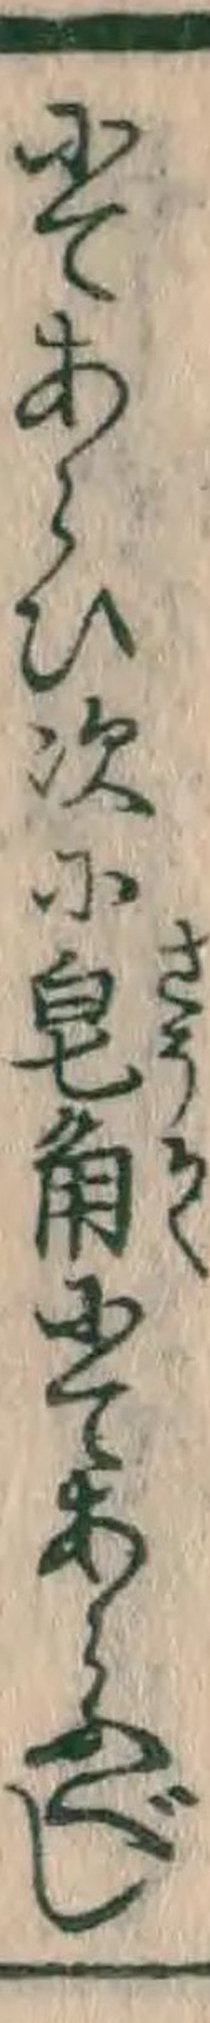にてあらひ次に皂角にてあらふべし
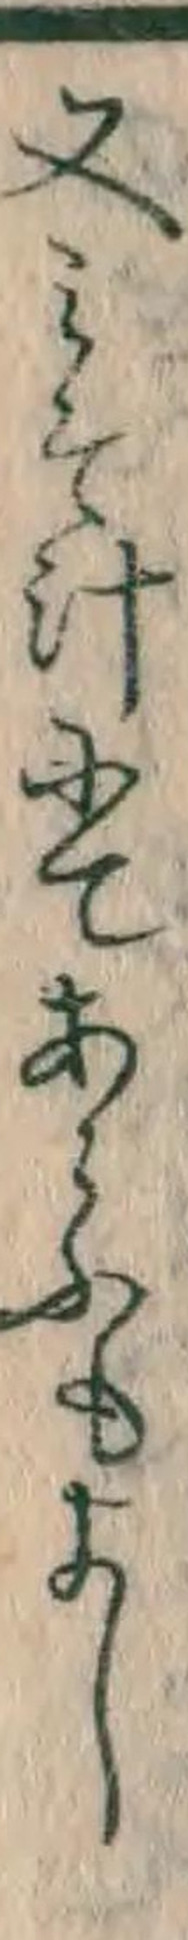又みそ汁にてあらふもよし
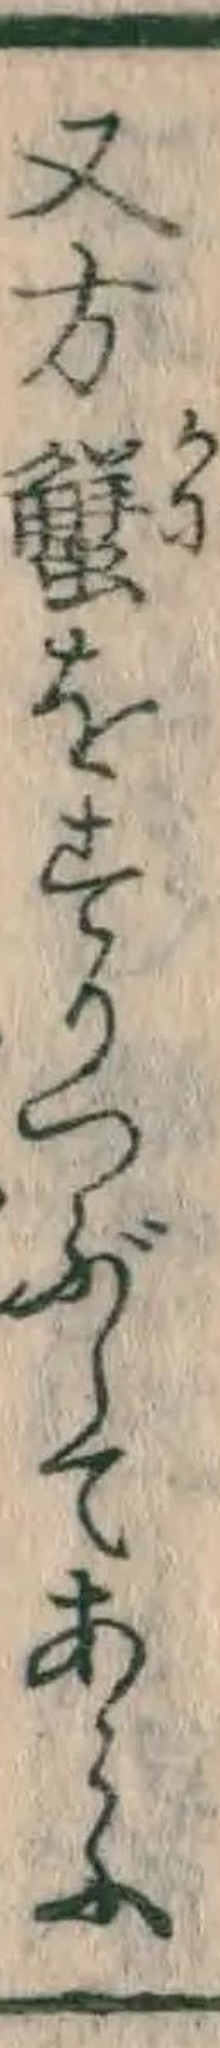又方蟹をすりつぶしてあらふ
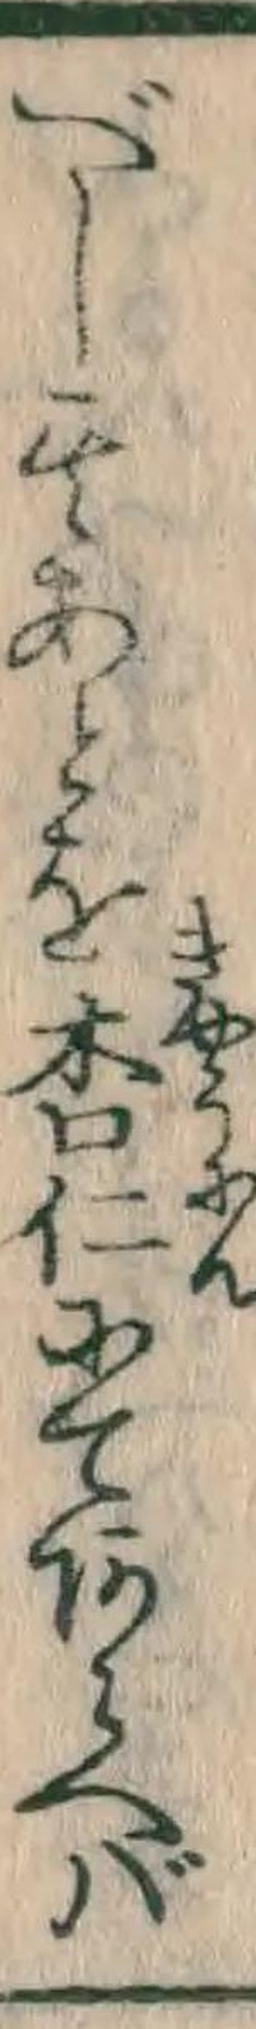べし其あとを杏仁にてあらへば
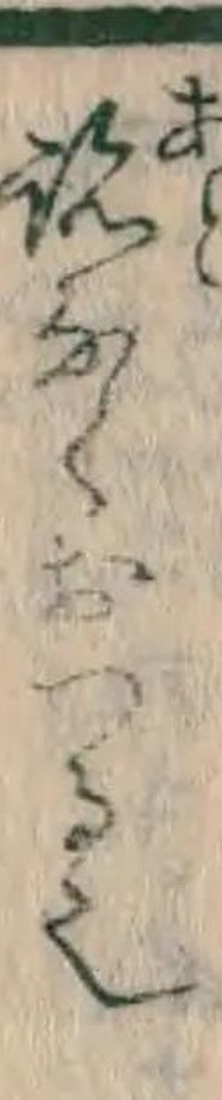跡なくおつる也
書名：広益秘事大全 3巻. [3]
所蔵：国立国会図書館 National Diet Library, JAPAN
